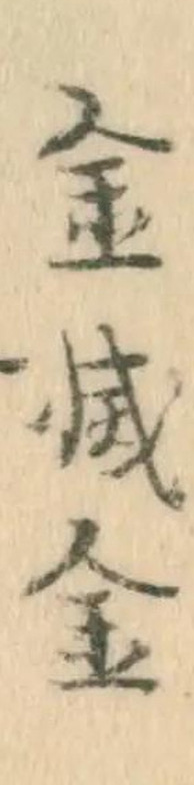金滅金

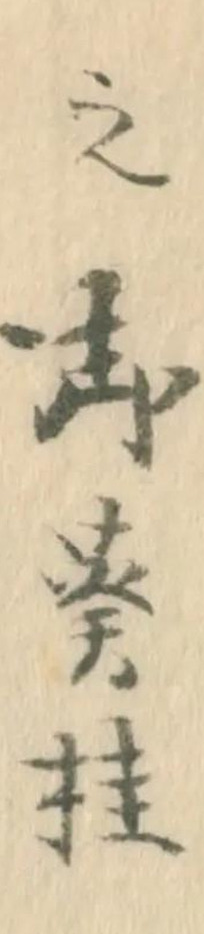之御葵桂
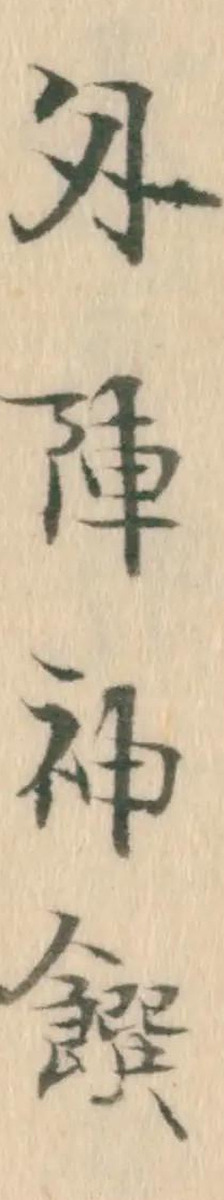外陣神饌
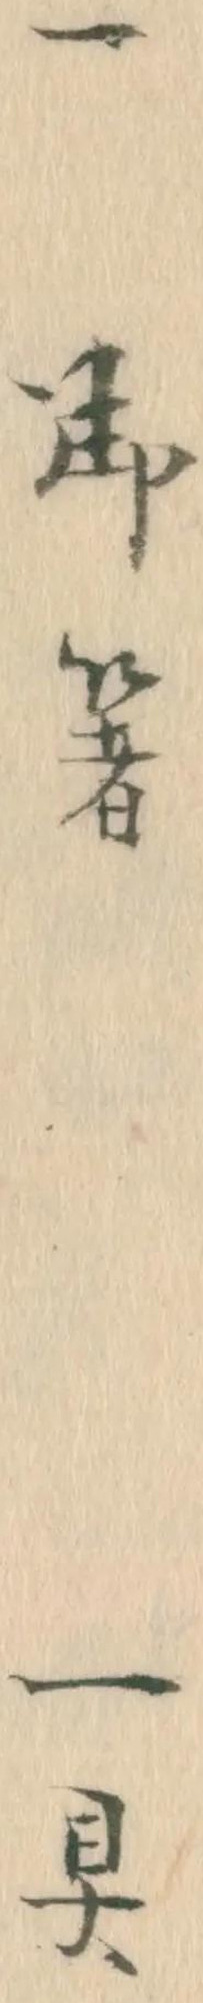一御箸一具
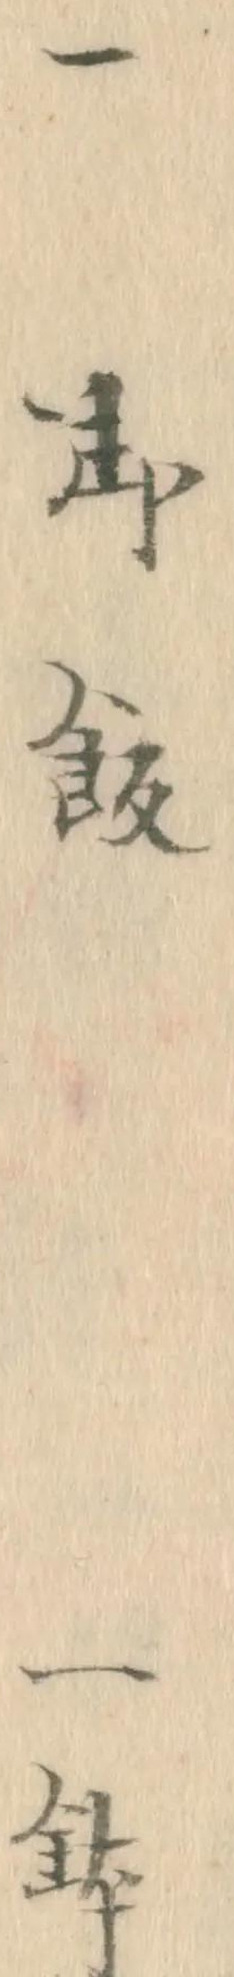一御飯一鉢
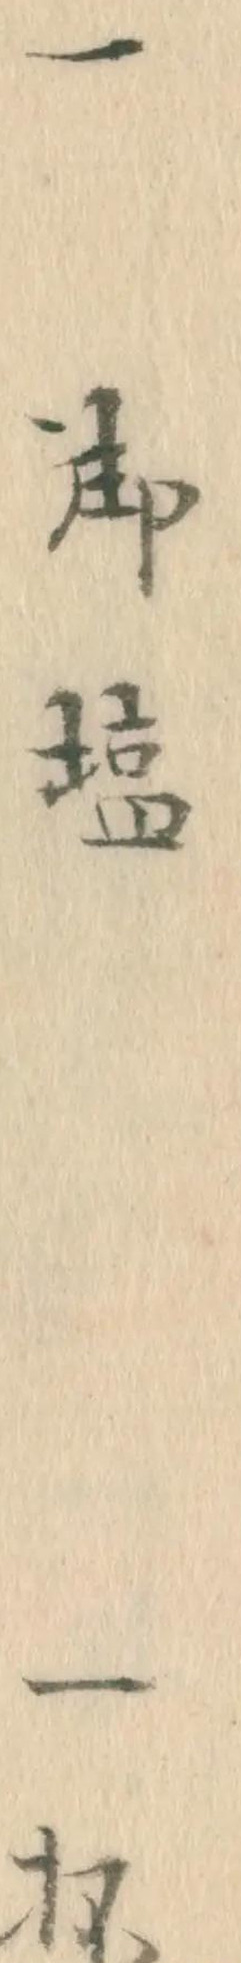一御塩一杯
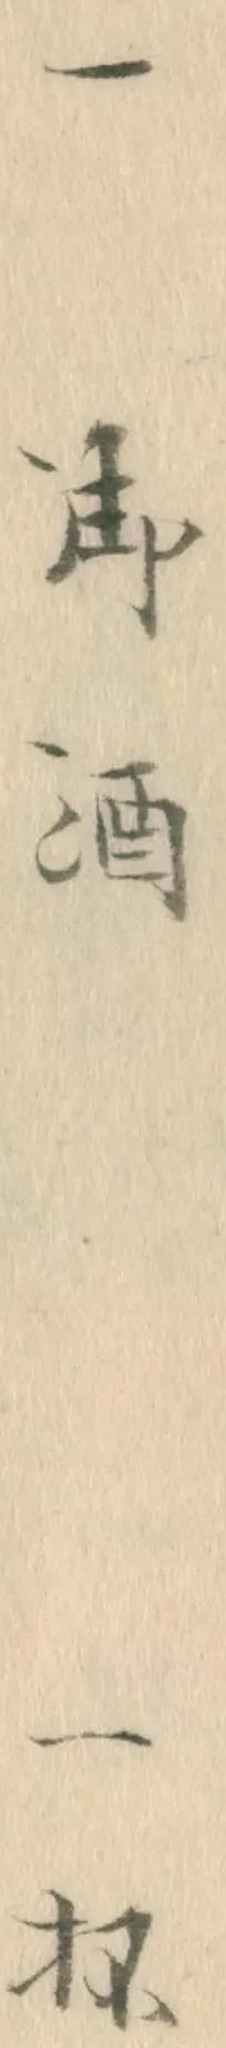一御酒一杯
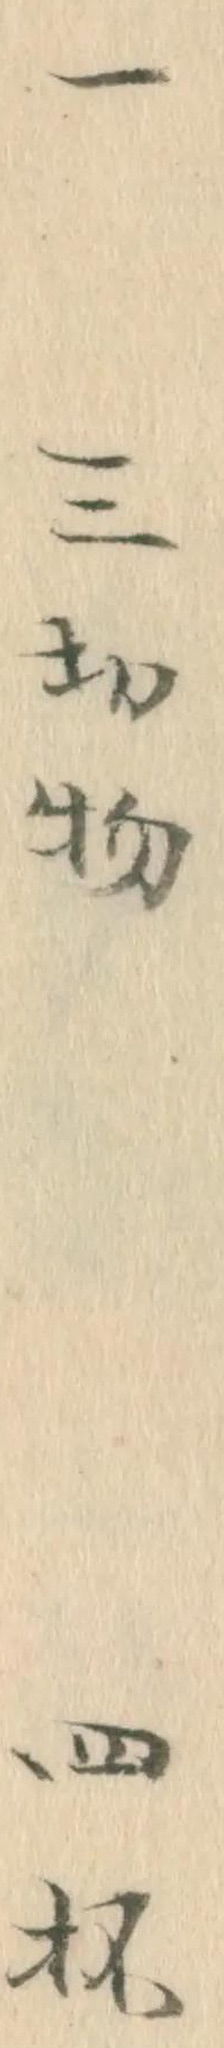一三切物四杯
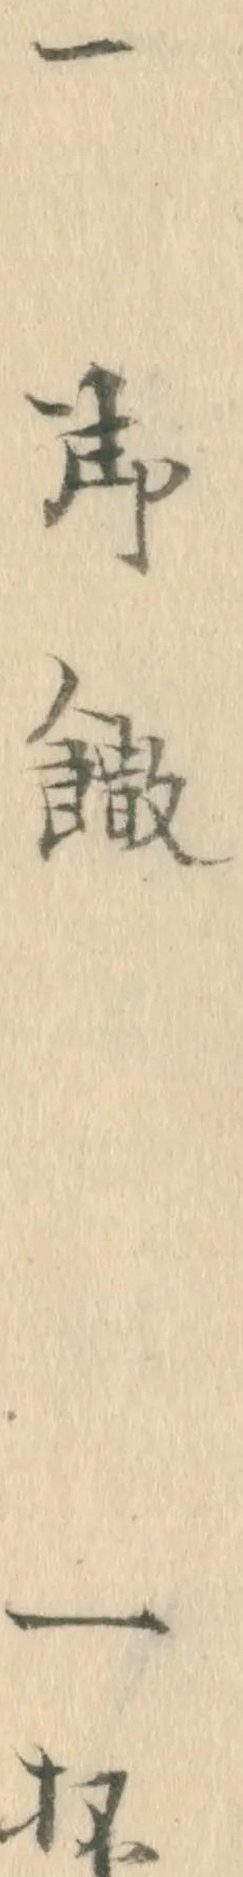一御箸一具

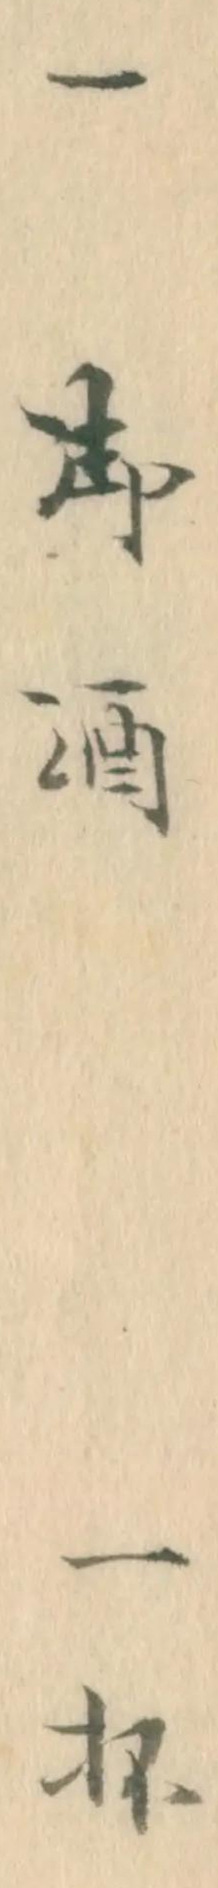一御酒一杯
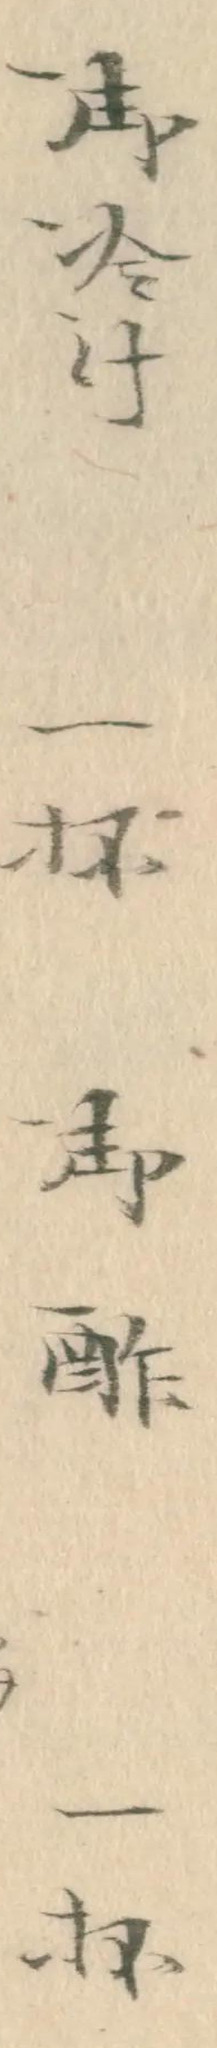御冷汁一杯御酢一杯
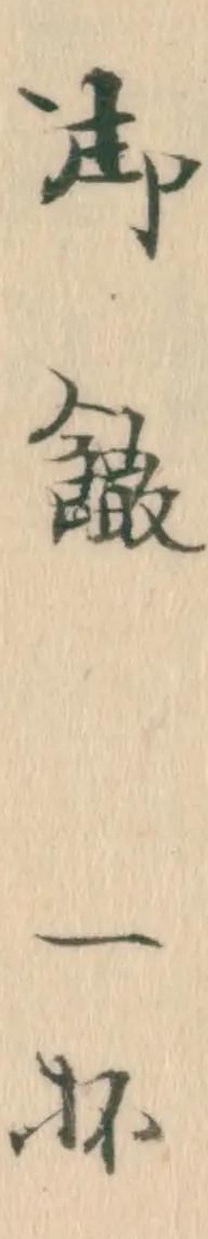御酒一杯
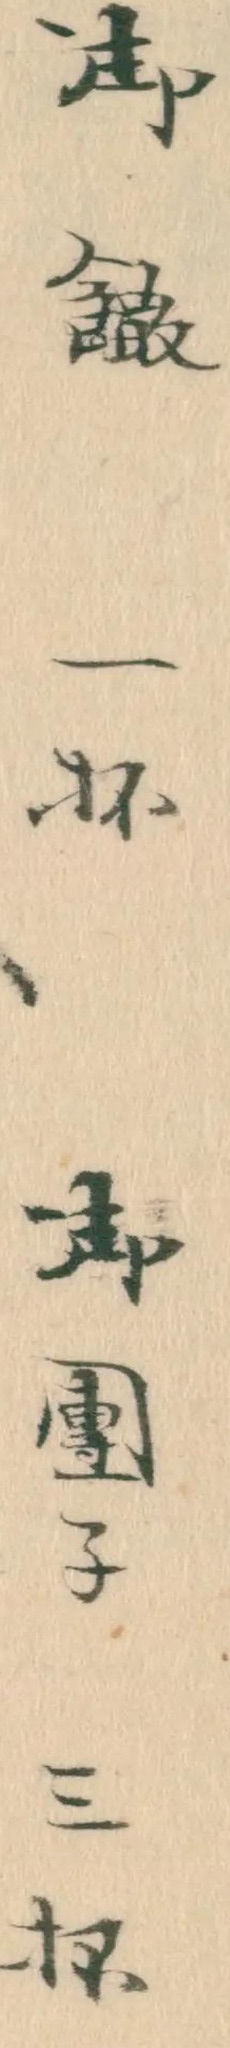御饊一杯御団子三杯
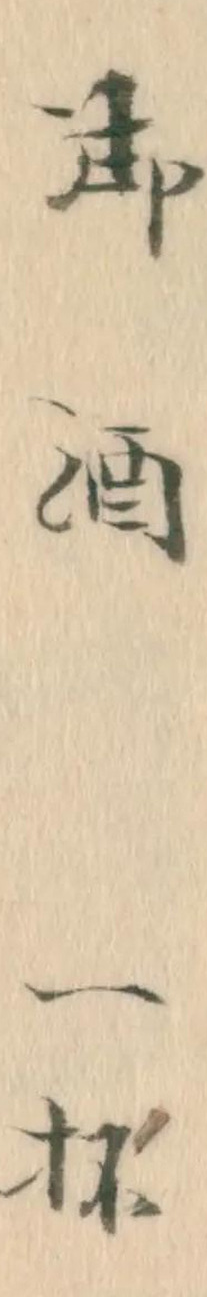御酒一杯
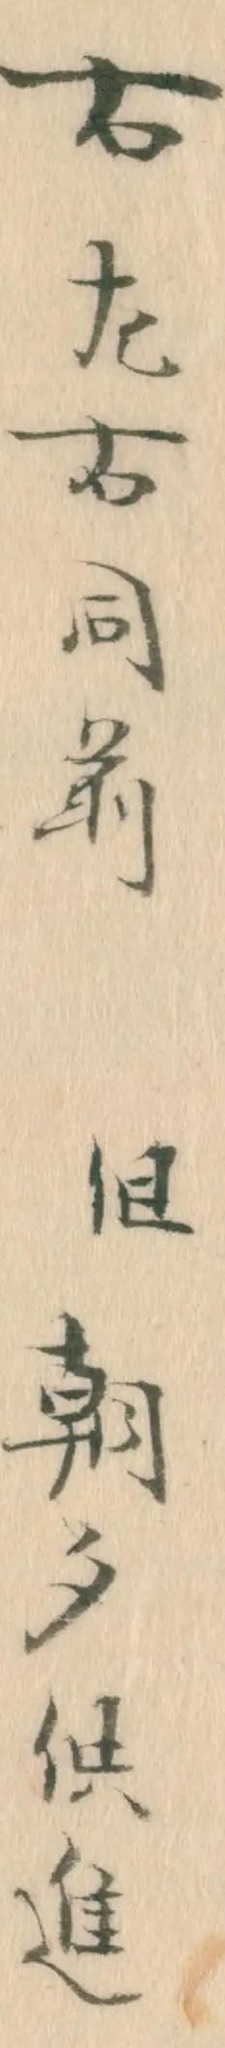右左右同前但朝夕供進

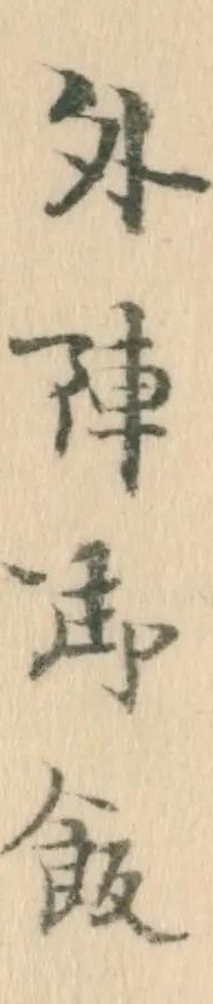外陣御飯
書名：葵御祭供進之神饌諸品色目書
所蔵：国立国会図書館 National Diet Library, JAPAN
